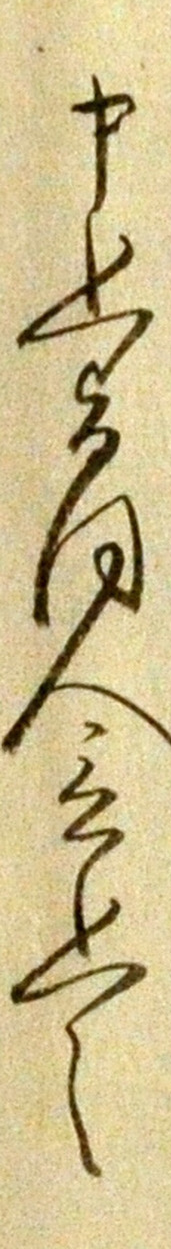申上旨同人言上之
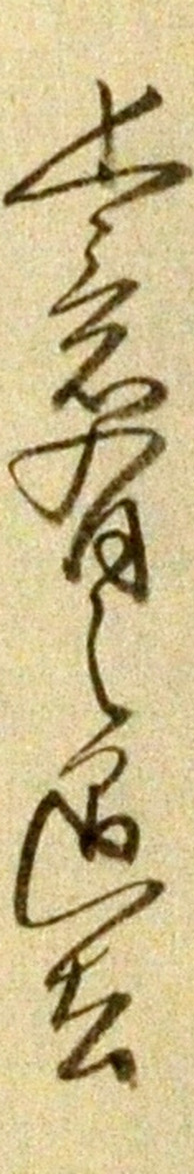上意有之退去
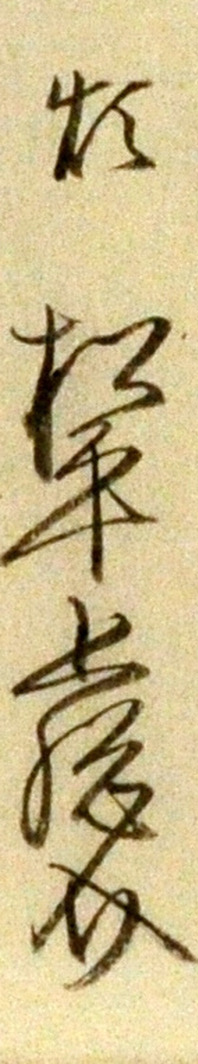煩松平上総介
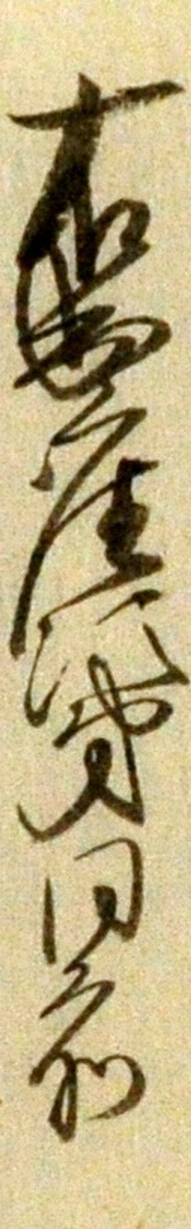右出座次第同前
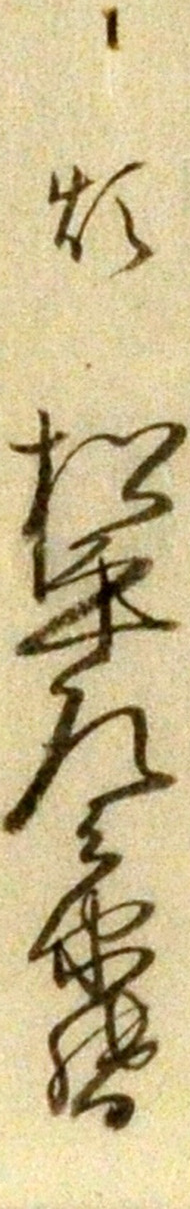煩松平左兵衛督
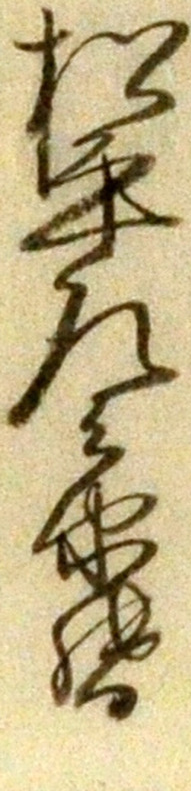煩松平左兵衛督
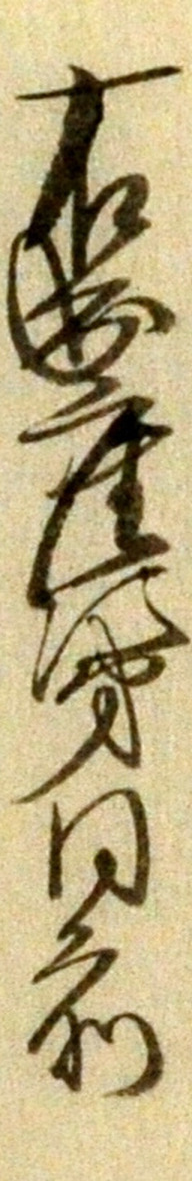右出座次第同前
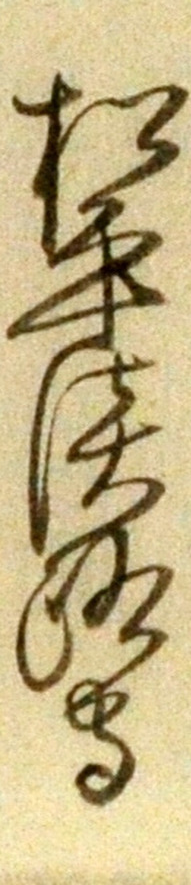松平淡路守
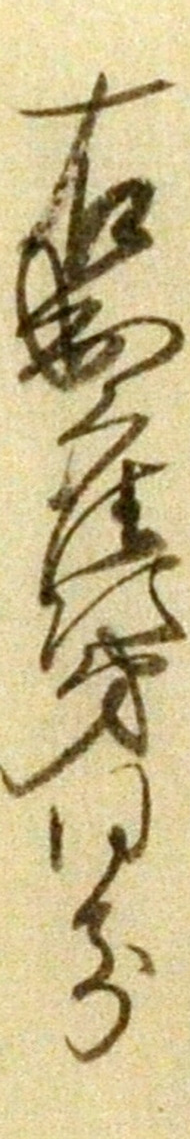右出座次第同前
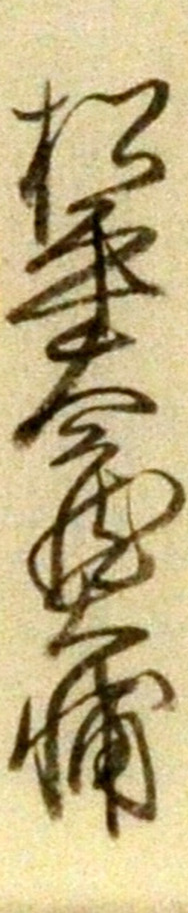松平大蔵大輔
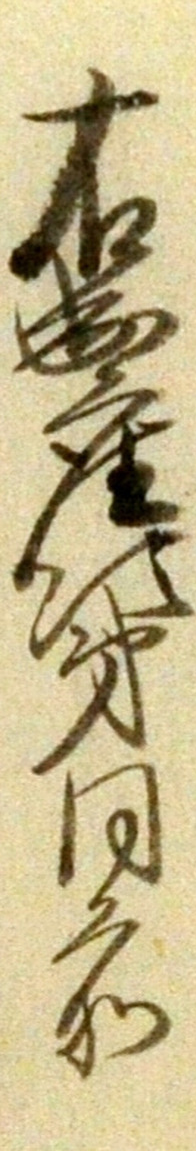右出座次第同前
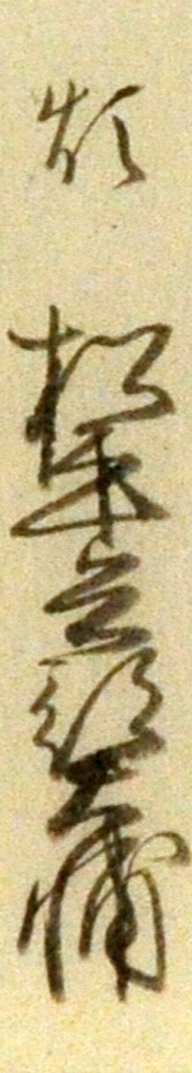煩松平兵部大輔

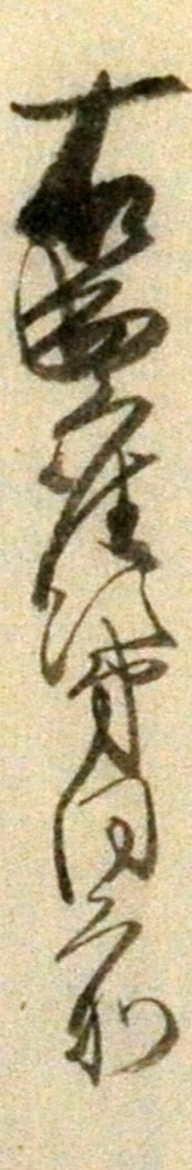右出座次第同前
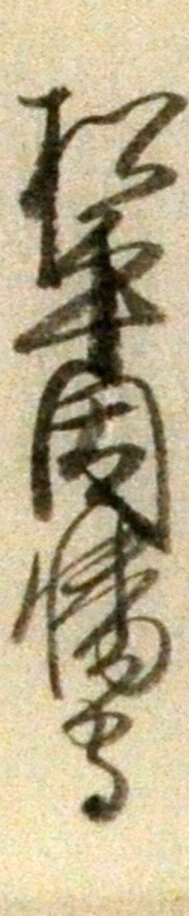松平因幡守
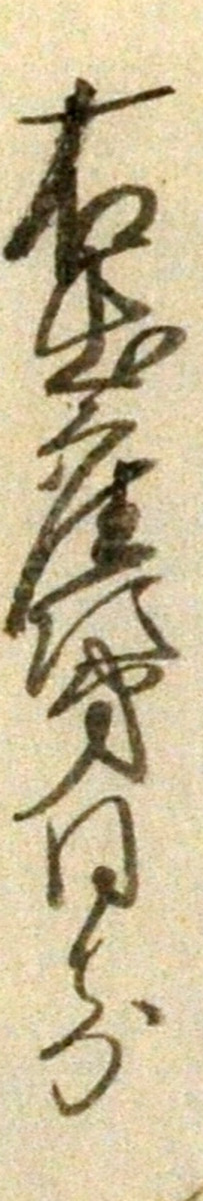右出座次第同前
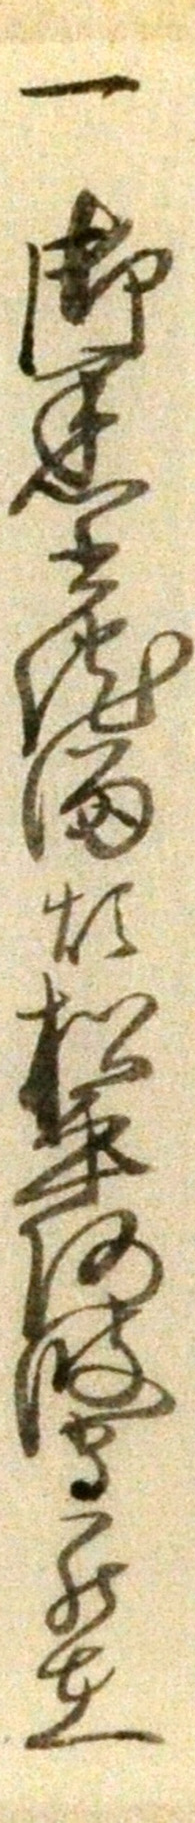一御黒書院溜煩松平阿波守罷在
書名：御馳走御能ノ節ノ留外
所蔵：伊那市立高遠町図書館・合同会社AMANE
